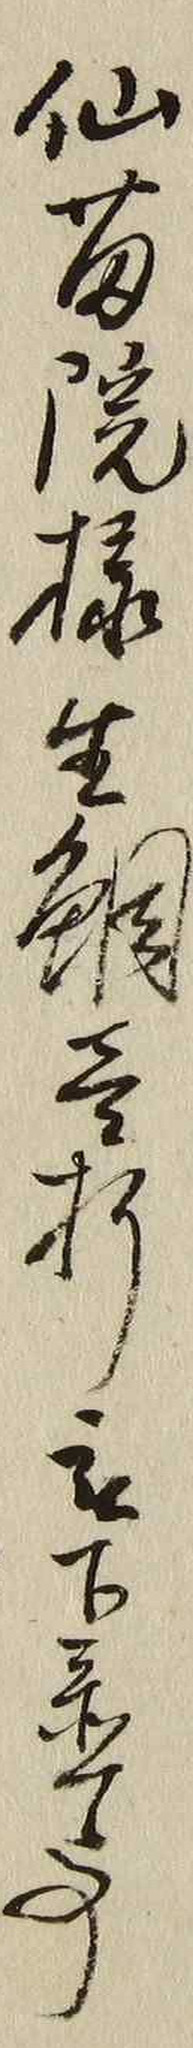仙苗院様生鯛壱折被下置候事
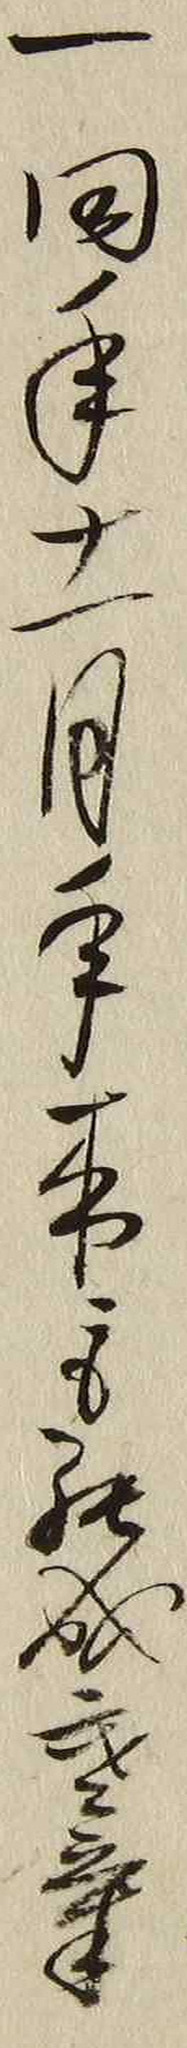一同年十一月年来ニも罷成寒気
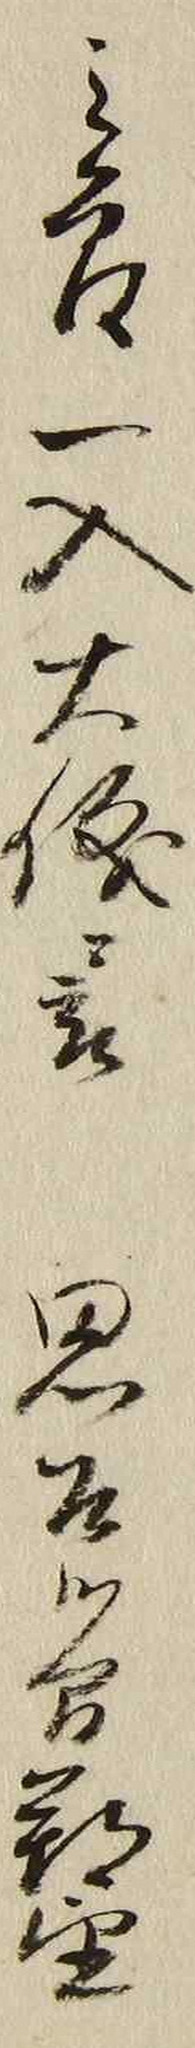之節一入大儀ニ被思召候間朔望
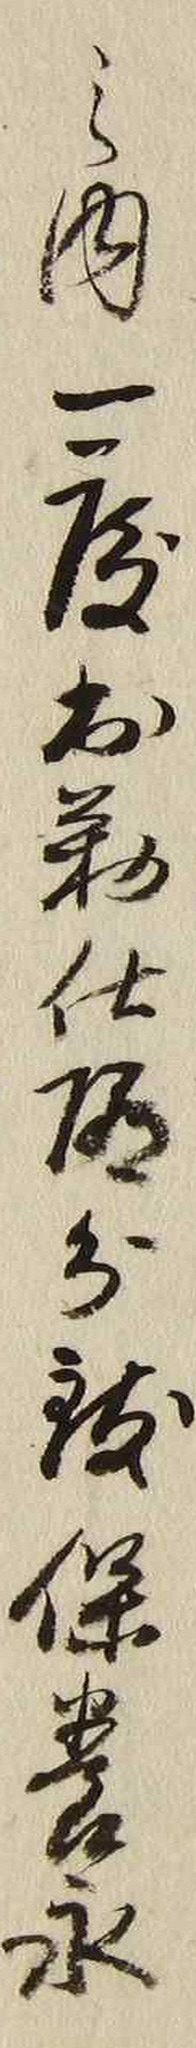之内一度出勤仕随分致保養永
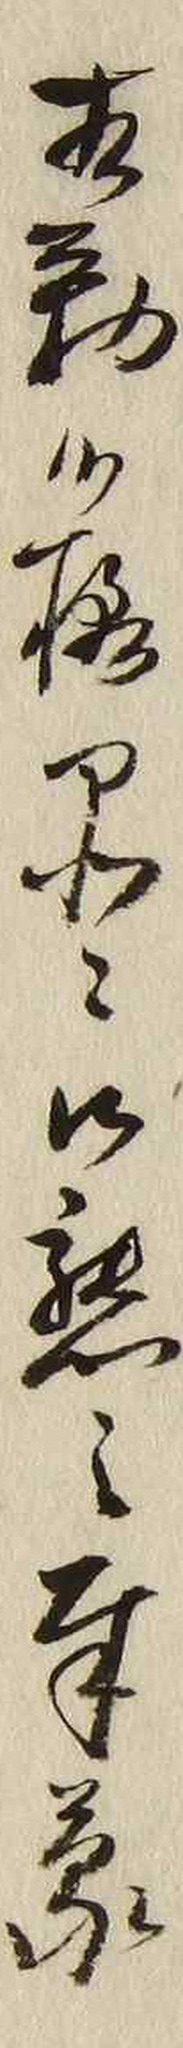相勤候様品々御懇之奉蒙
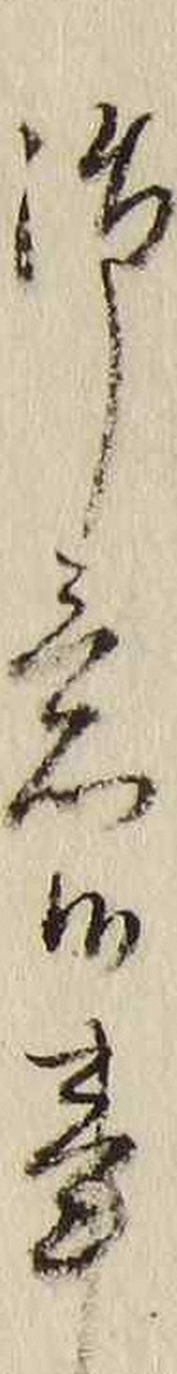御意候事

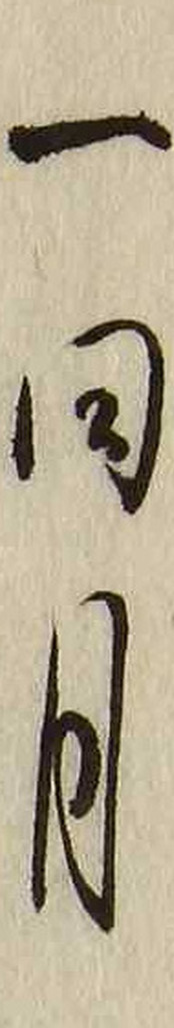一同月
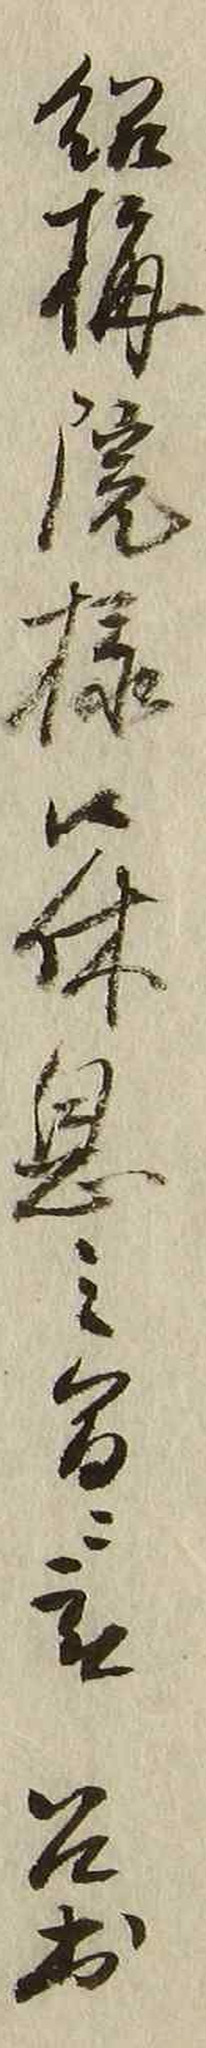紹栴院様御休息之間ニ被召出
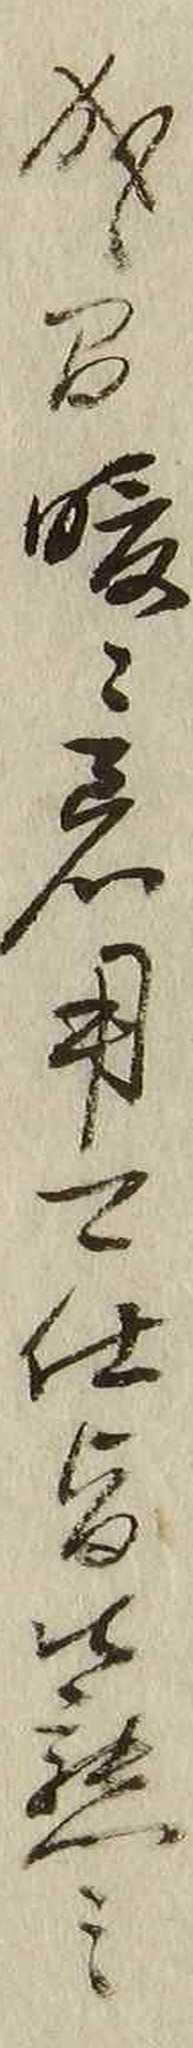成候間暖々着用可仕旨御懇之
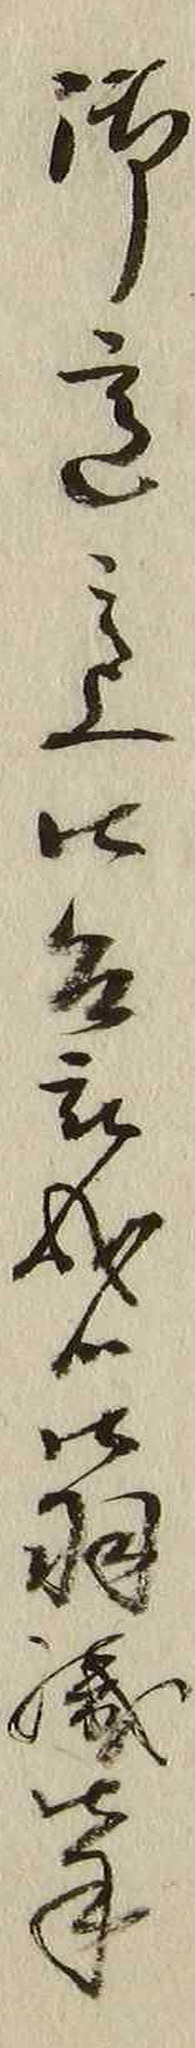御意之上御召被成候御羽織御手
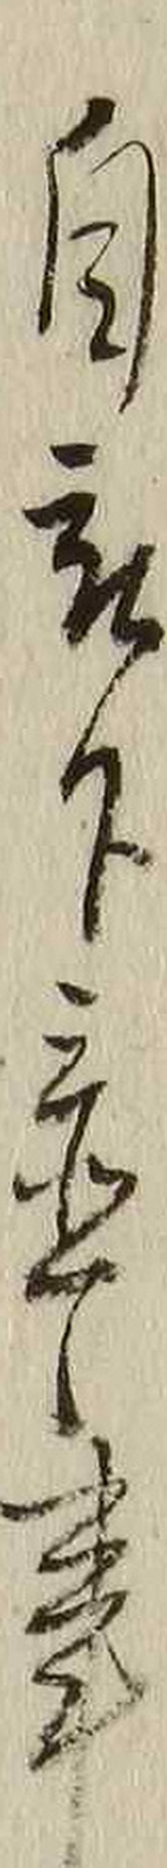自被下置候事
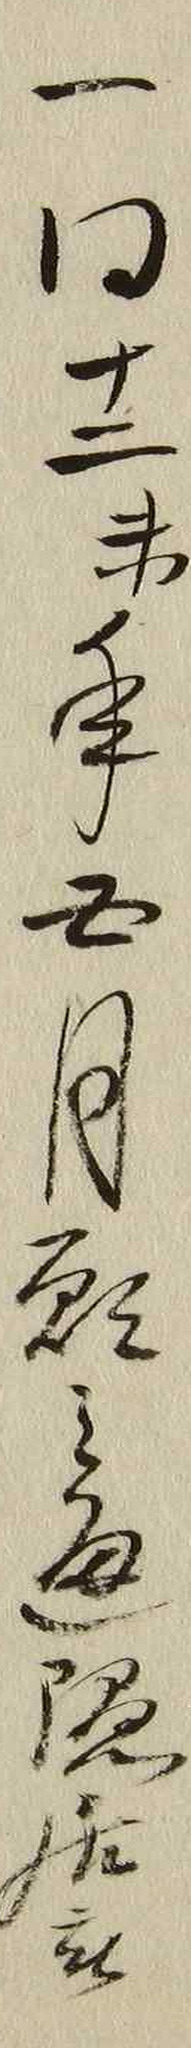一同十二未年五月願之通隠居被
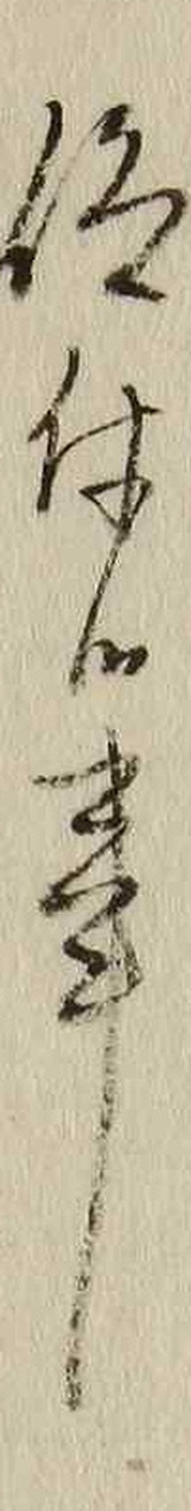仰付候事
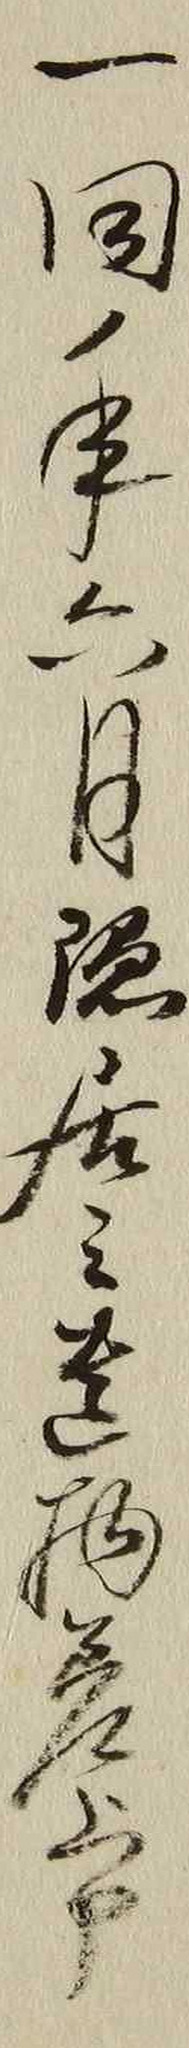一同年六月隠居之遺物差上申
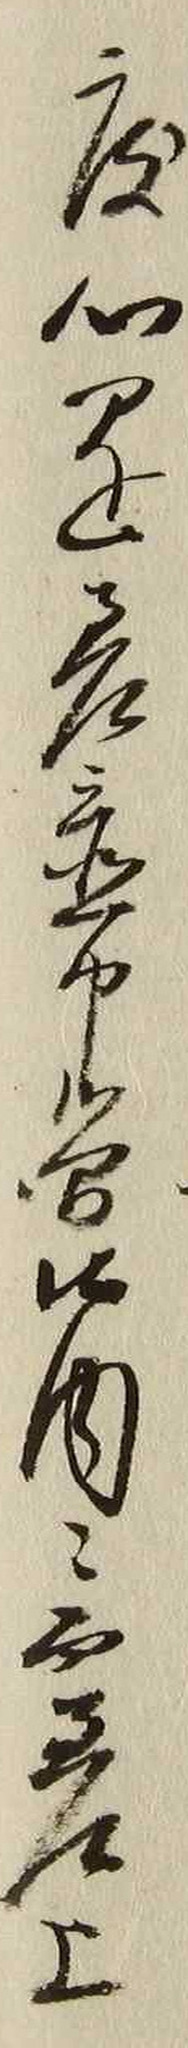度心懸差置申候間御内ニ而差上
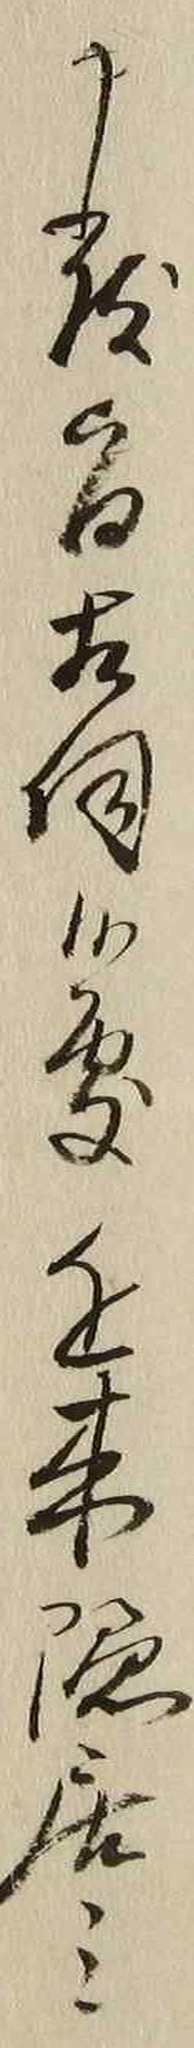申度旨相伺候処近来隠居之
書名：諸士系譜　巻之351　す之部1
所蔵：会津若松市立会津図書館
